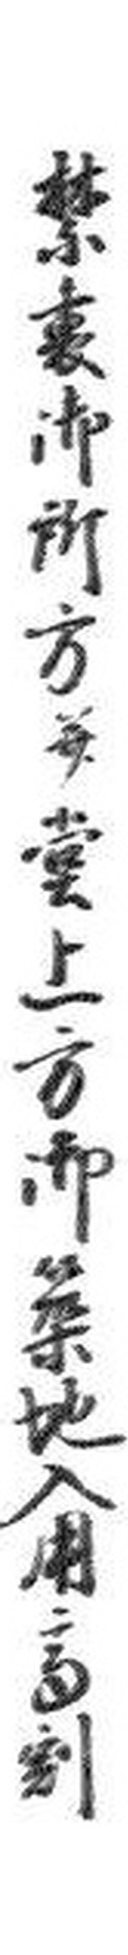禁裏御所方并堂上方御築地入用高割
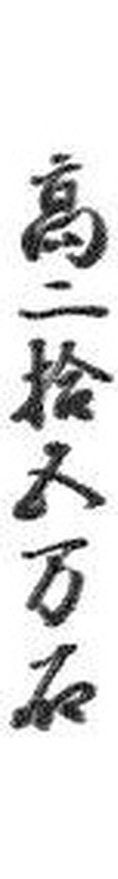高二拾五万石
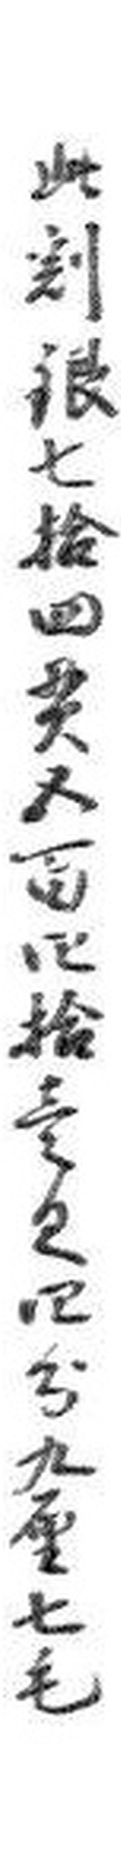此割銀七拾四貫五百四拾壱匁四分九厘七毛
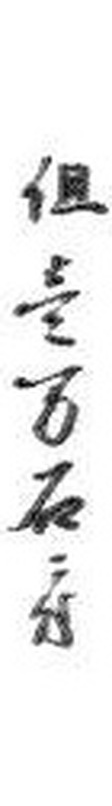但壱万石ニ付
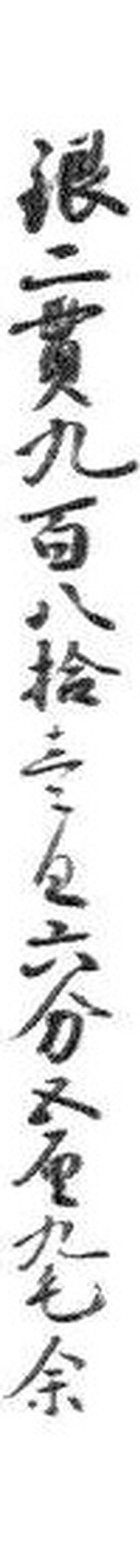銀二貫九百八拾壱匁六分御厘九毛余
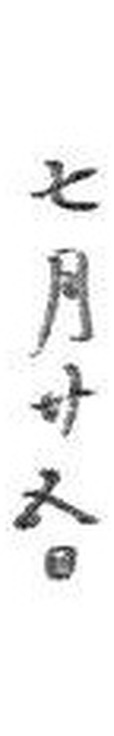七月十九日

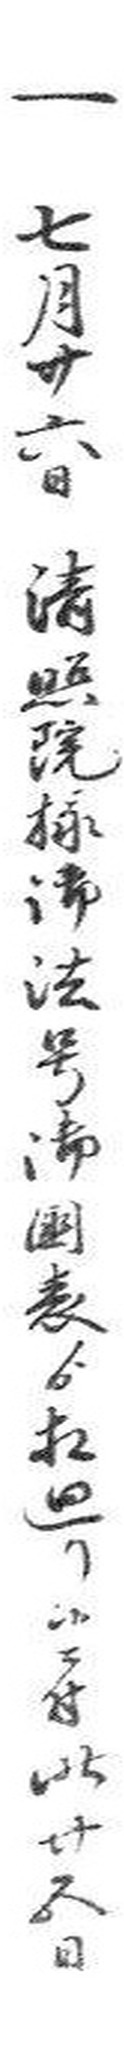一七月廿六日清照院様御法号御国表ゟ相廻り候ニ付昨廿五
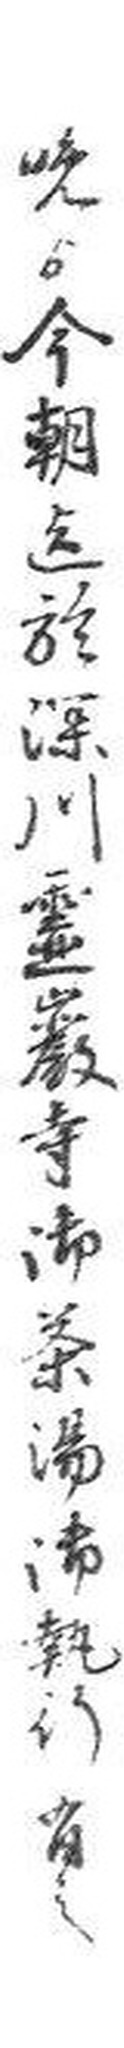晩ゟ今朝迄於深川霊巌寺御茶湯御執行有之
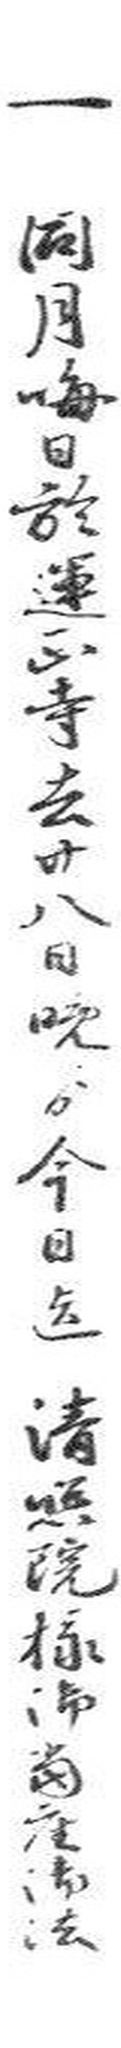一同月晦日於運正寺去廿八日晩ゟ今日迄清照院様御当座御
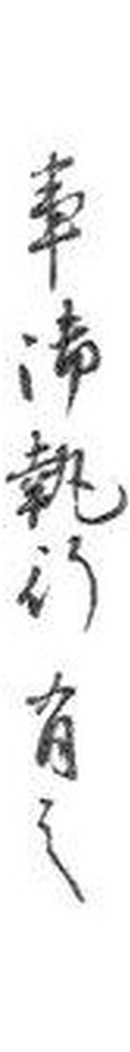亊御執行有之
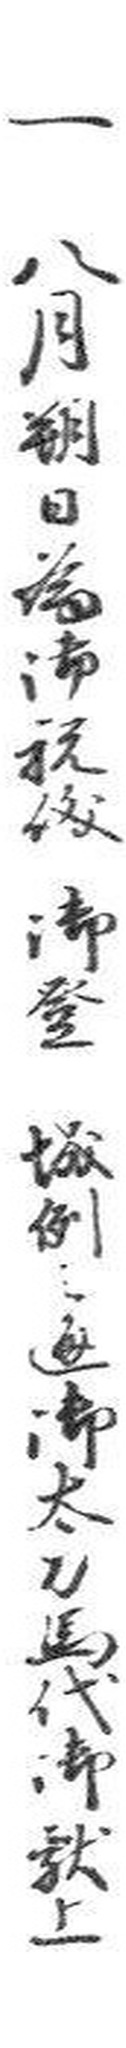一八月朔日為御祝儀御登城例之通御太刀馬代御献上
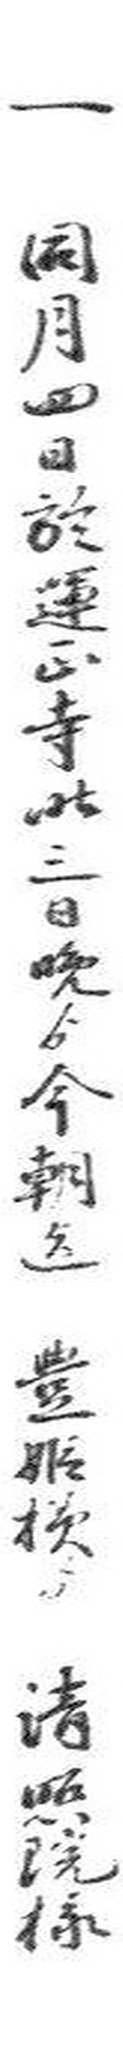一同月四日於運正寺昨三日晩ゟ今朝迄豊姫様ゟ清照院様
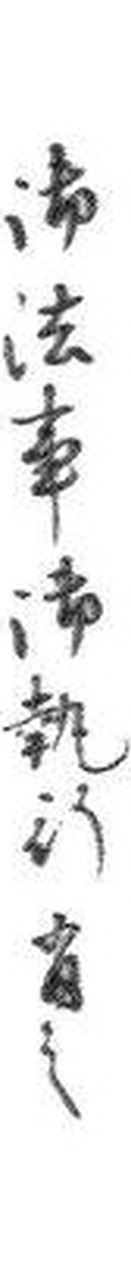御法事御執行有之
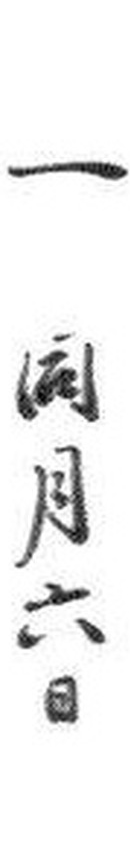一同月六日
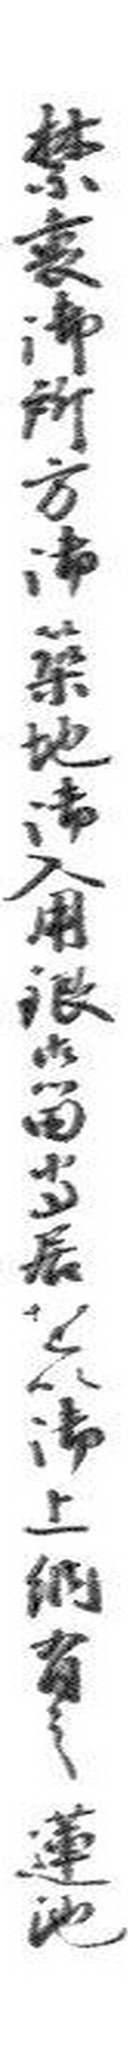禁裏御所方御築地御入用銀御留守居を以御上納有之蓮
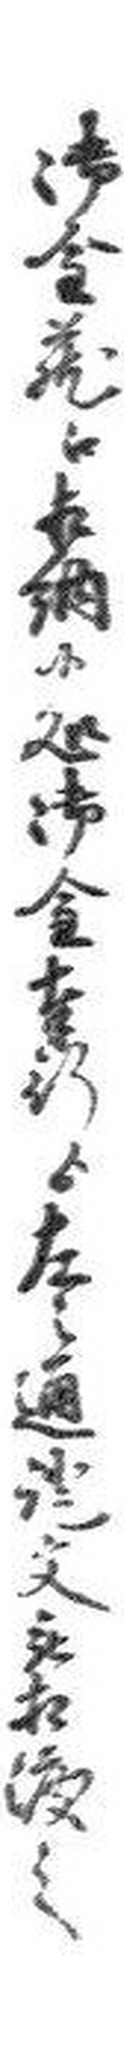御金蔵江相納候処御金奉行ゟ左之通証文被相渡之
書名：家譜 二十九 吉邦公 従正徳二年到正徳三年
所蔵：福井県文書館 Fukui Prefectural Archives
